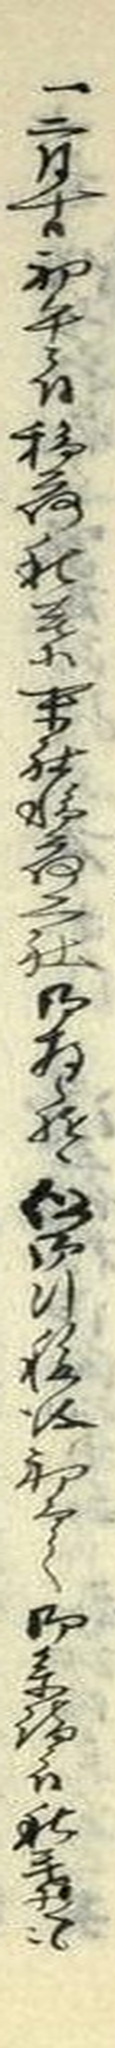一二月十日初午ニ付稲荷秋葉末社稲荷二社御拝被遊候但御引移後初而之御参詣ニ付秋葉へも
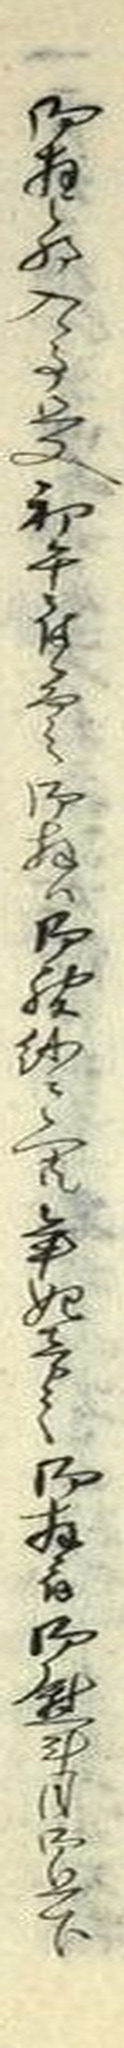御拝被為入候事且又初午ニ付候而之御拝ハ御服紗ニ候へ共年始旁之御拝ニ付御熨斗目御上下
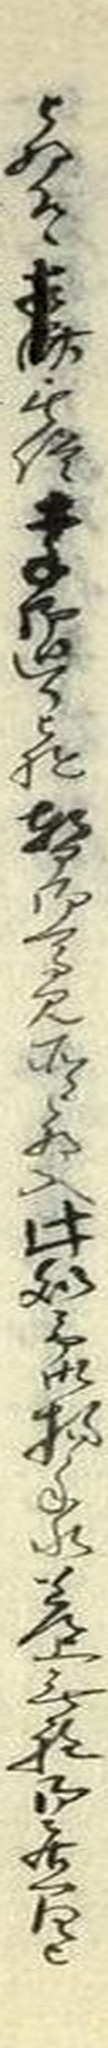被為召候其儘土手御廻り被遊暫御馬見所へ被為入此処ニ而御揚手水差上無程御居間被
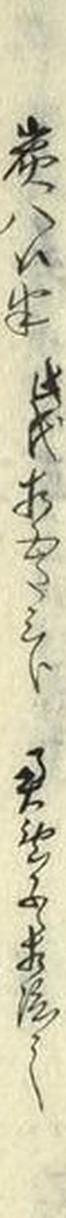炭八俵半此代拾五匁三分奥台子へ相渡之
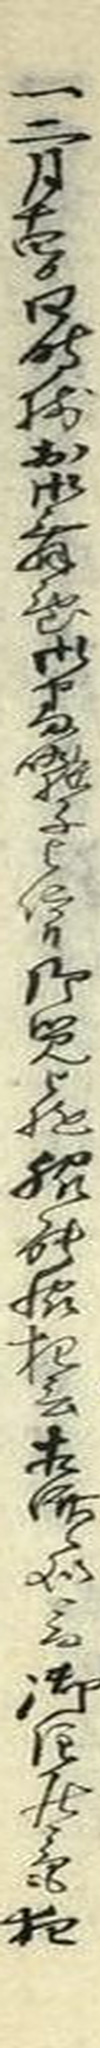一二月十四日四時揃於御舞台御番囃子被仰付御覧被遊脇能脇狂言相済候処ニ而御住居ニ而も狂
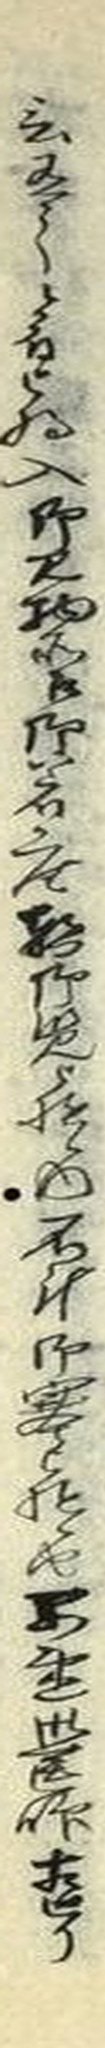言有之ニ付被為入御見物所江御着座暫御覧被遊候内不計御塞被遊候由早速御医師相廻り
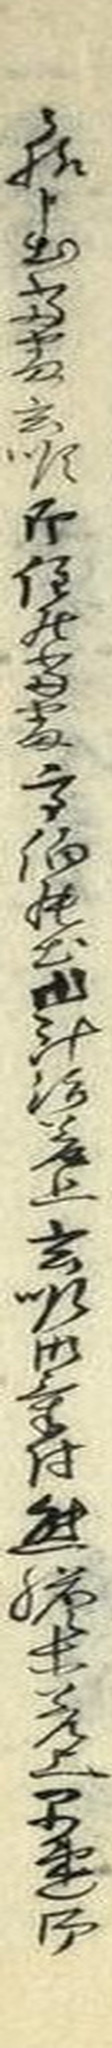候様申出当番玄順御住居当番高伯罷出御針治差上玄順御気付熊膽等差上早速御
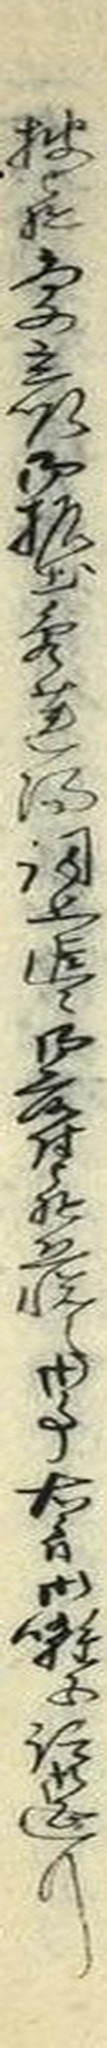披被遊尚又玄順御振出黄蓮湯調上追々御落付被遊恐悦之御事右ニ付御囃子跡御延引

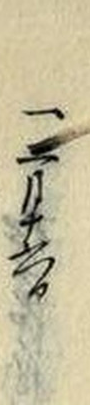一二月十六日
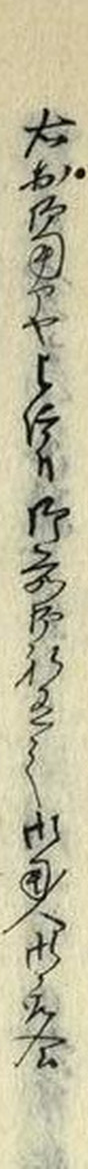右於御用部屋被仰付御前御礼有之御用人御取合
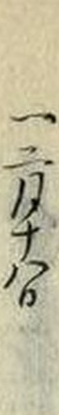一二月十六日
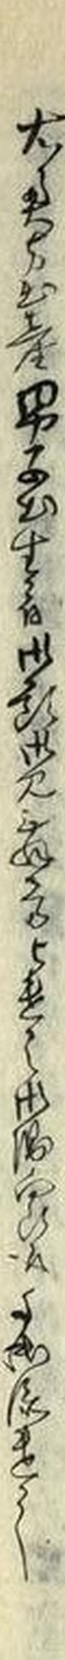右奥方出産男子出生ニ付御歓御見舞方被遣之御側向頭取手紙添遣之
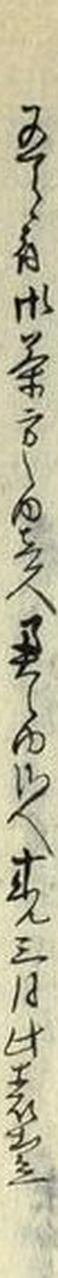有之候ニ付御茶方之内壱人奥之内弐人来ル三月此表出立奥石川玄久
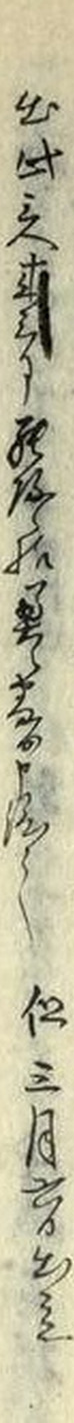出此三人来三月罷帰候様奥之番ゟ申渡之但三月六日出立
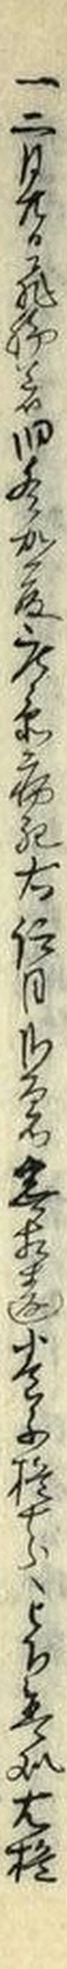一二月廿日飛脚着旧冬加藤庄兵衛病死右跡目弐百石無相違養子権十郎へ被下置候処右権
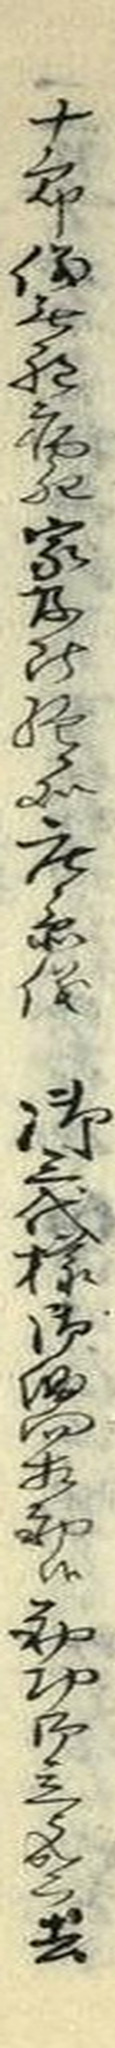十郎儀無程病死家及断絶候処庄兵衛儀御三代様御側向相勤候勤功御立被成候ハ去
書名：少傅日録抄（斉善付側向頭取日記、在府）
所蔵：福井県文書館 Fukui Prefectural Archives
